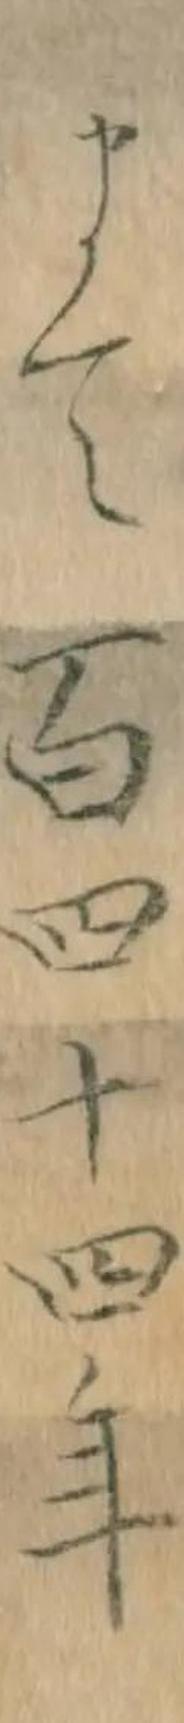にて百四十四年
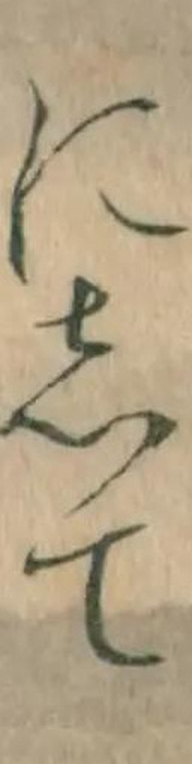にして
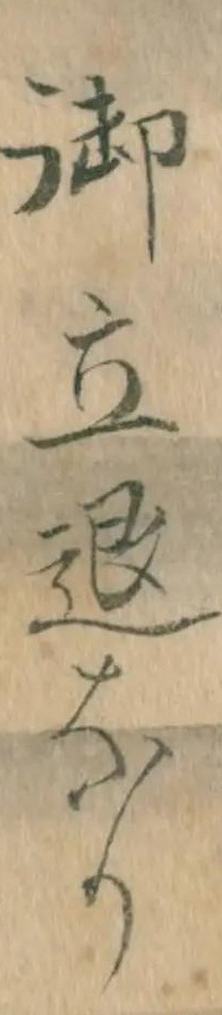御立退なり

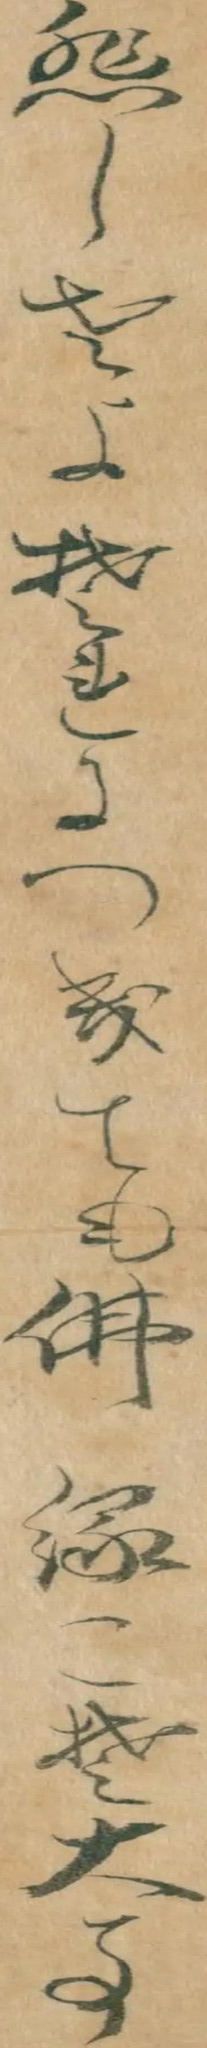悲しさよそれにつきても仏縁こそ大事
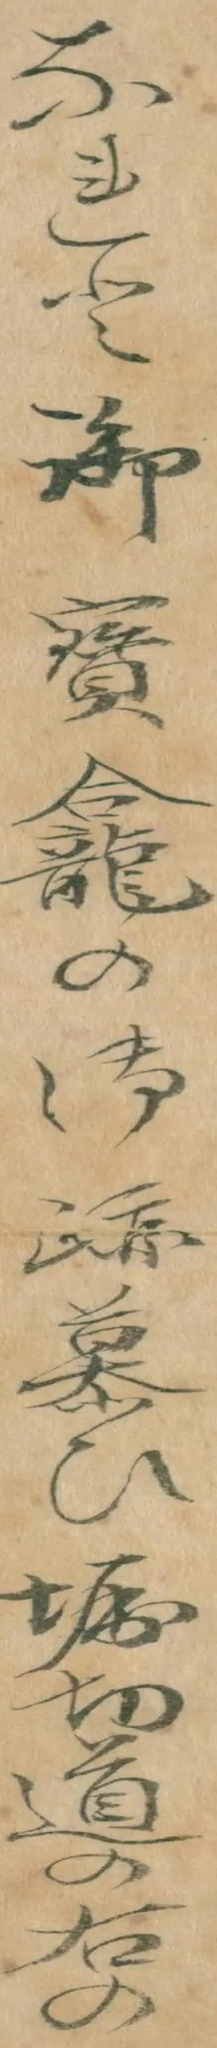なれと御宝龕の御跡慕ひ堀切道の右の
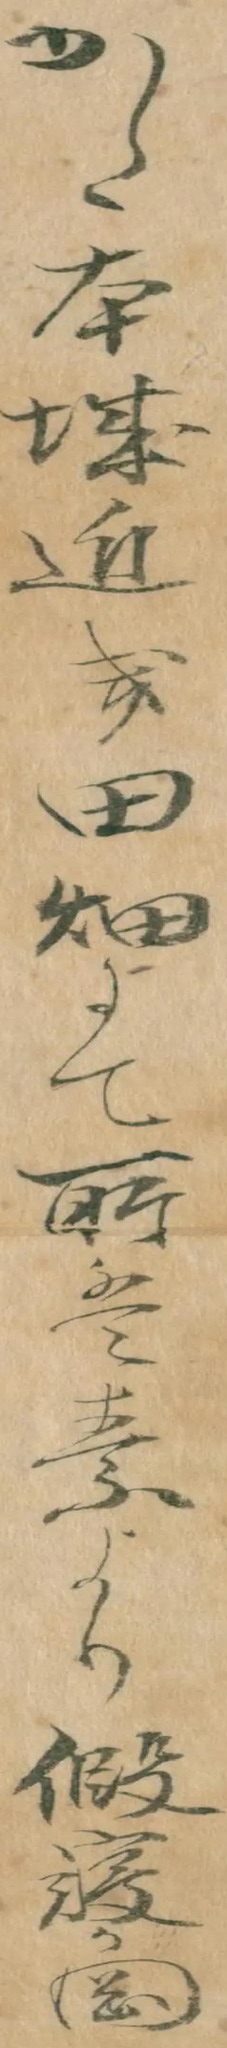かた本城近き田畑にて所は素より仮寝ヶ岡
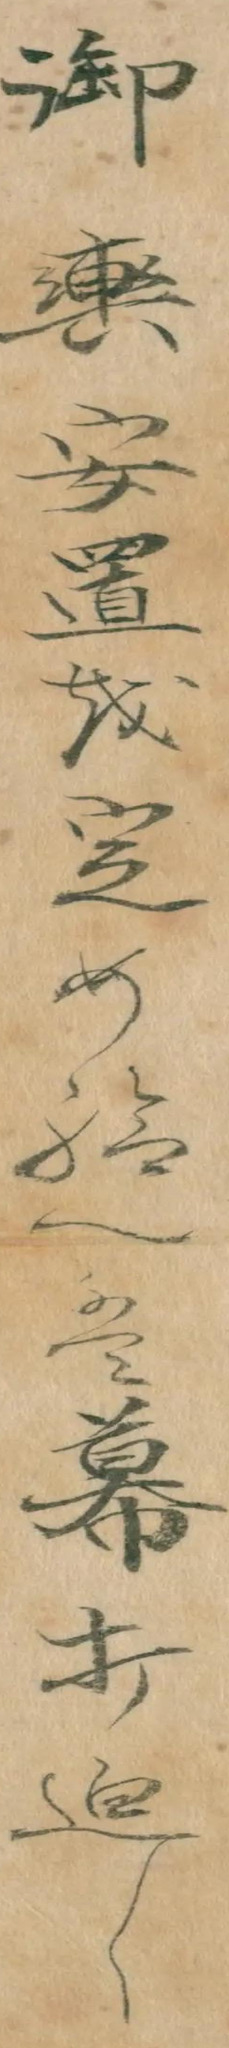御輿安置を定め給へは幕打廻し
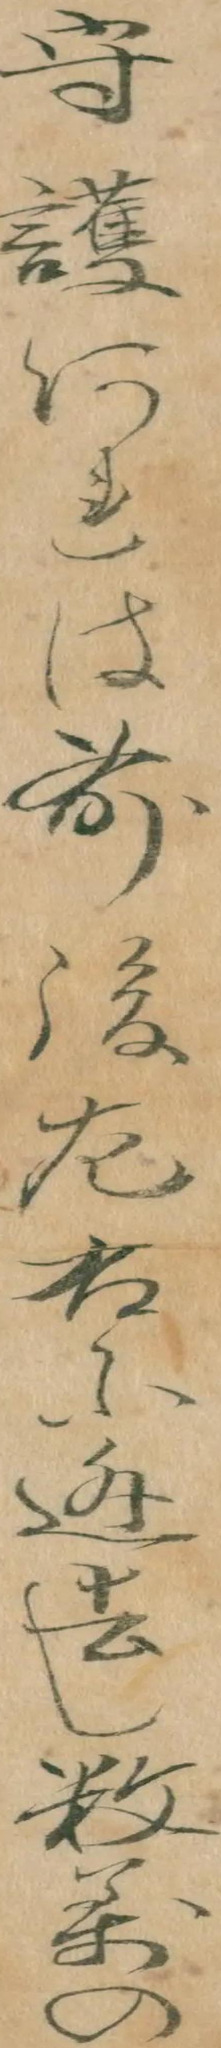守護あれは前後左右に逃去し数万の
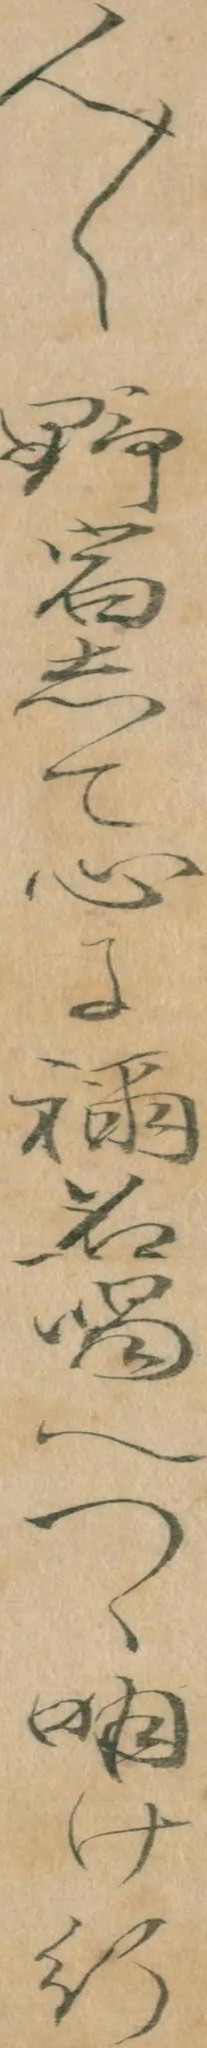人〳〵野宿して心に称名唱へつゝ明け行
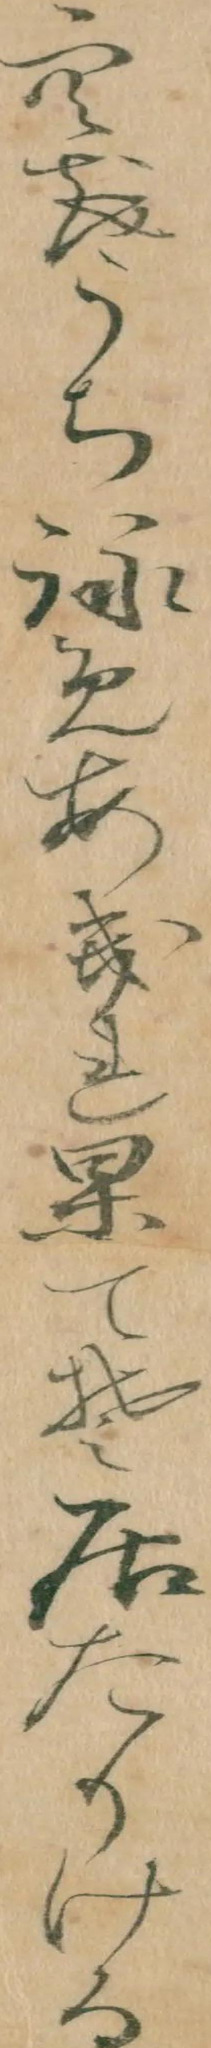空をうち詠めあきれ果てそ居たりける
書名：俗語之種. [3]
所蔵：国立国会図書館 National Diet Library, JAPAN
